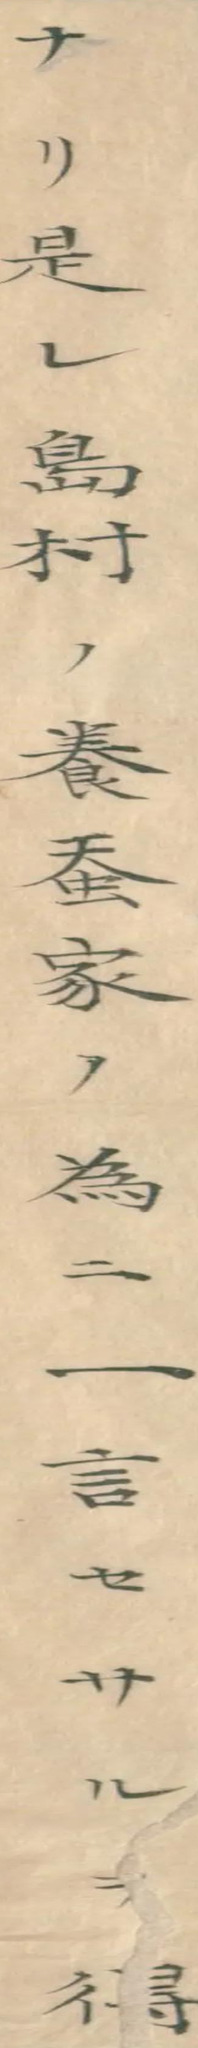ナリ是レ島村ノ養蚕家ノ為ニ一言セサルヲ得

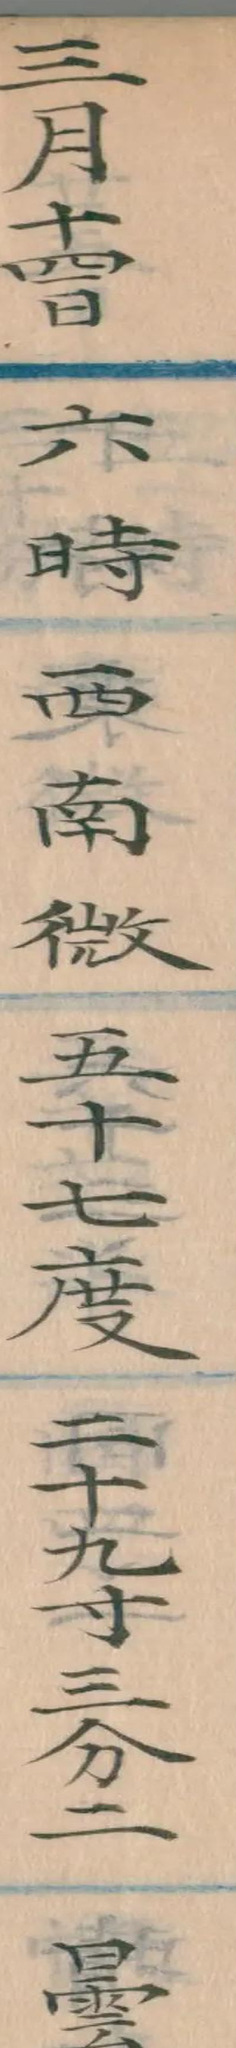三月十四日六時西南微五十七度二十九寸三分二曇
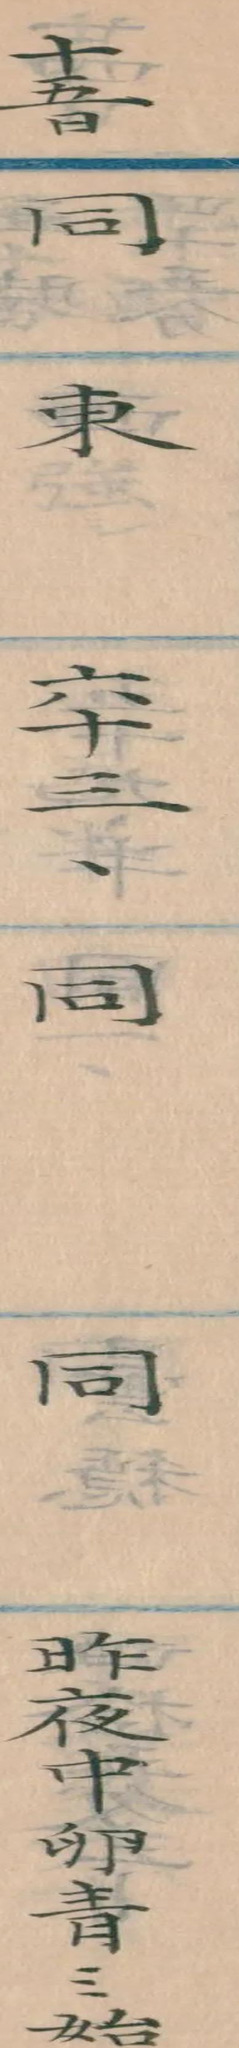十五日同東六十三ヽ同同昨夜中卵青ミ始ム
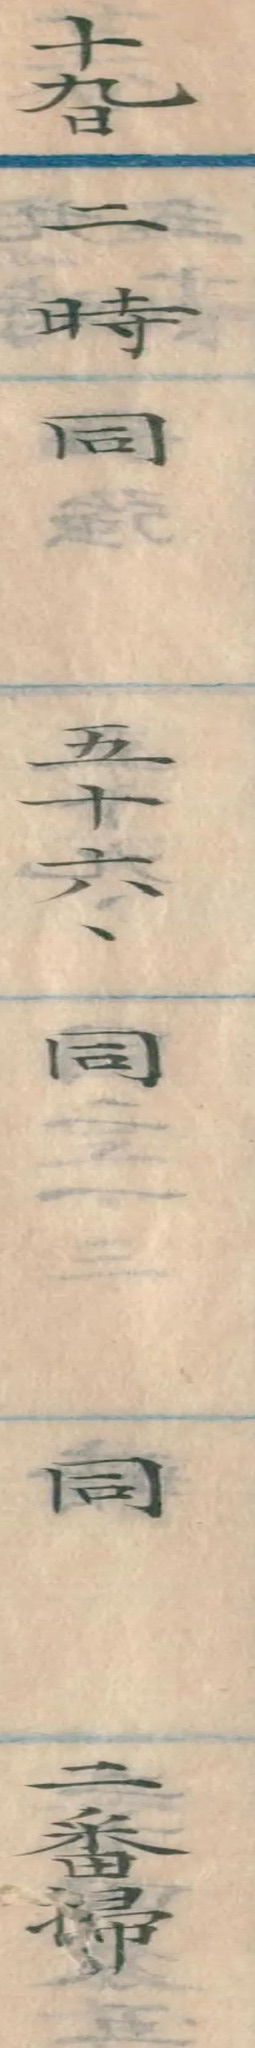十九日二時同五十六ヽ同同二番掃
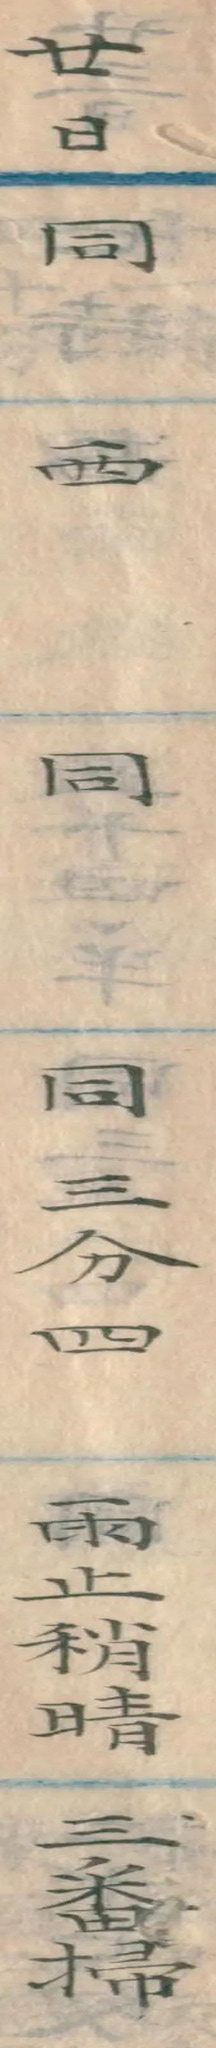廿日同西同同三分四雨止稍晴三番掃
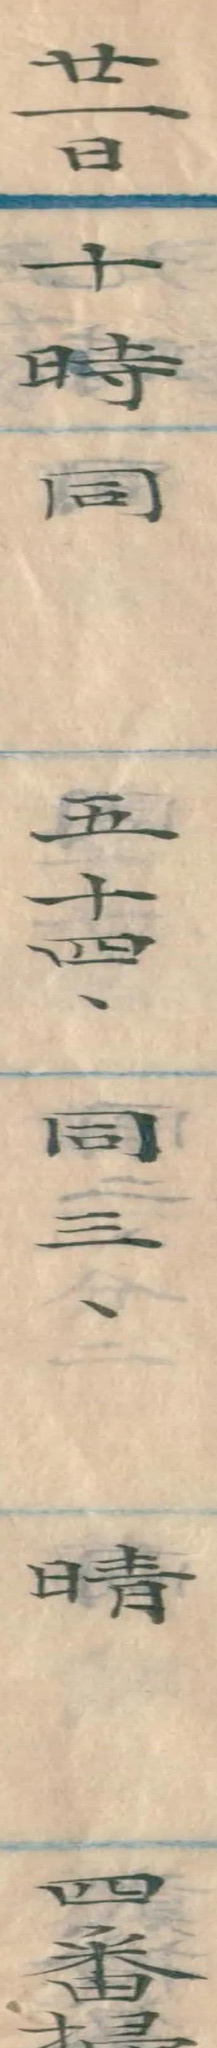廿一日十時同五十四ヽ同三ヽ晴四番掃

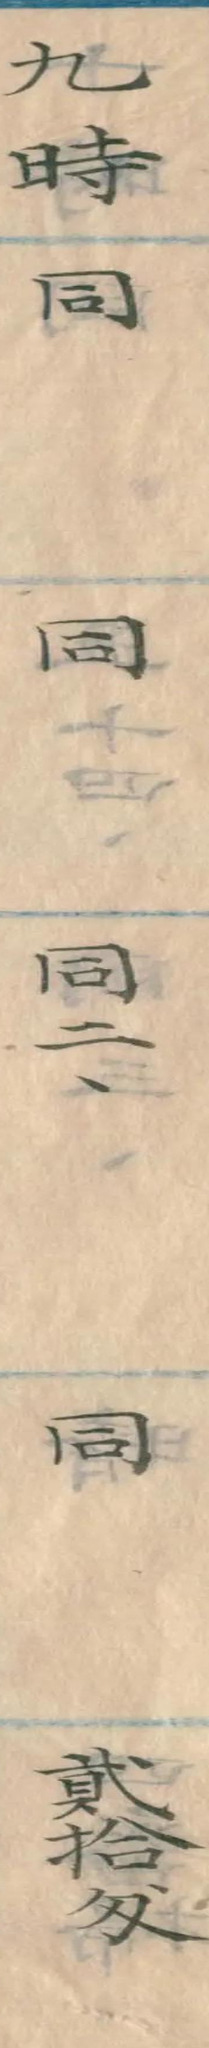九時同同同二ヽ同弐拾匁

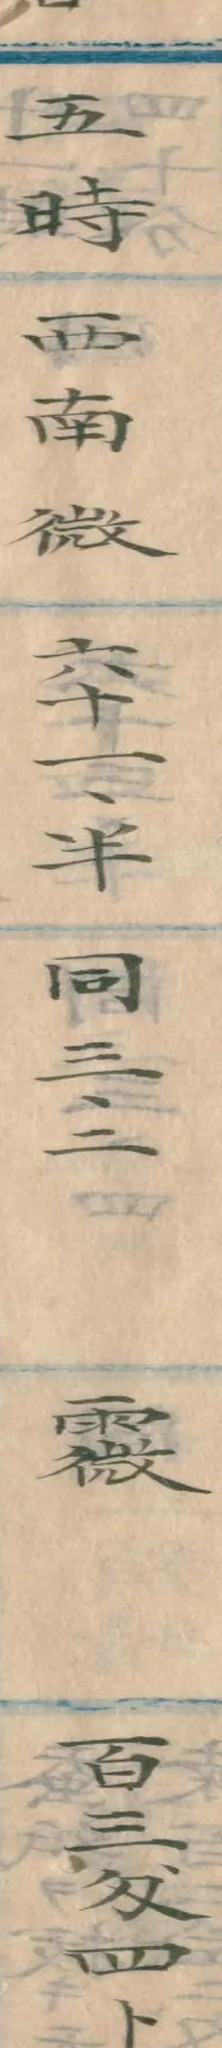廿七日五時西南微六十一ヽ半同三ヽ二霺百三匁四分
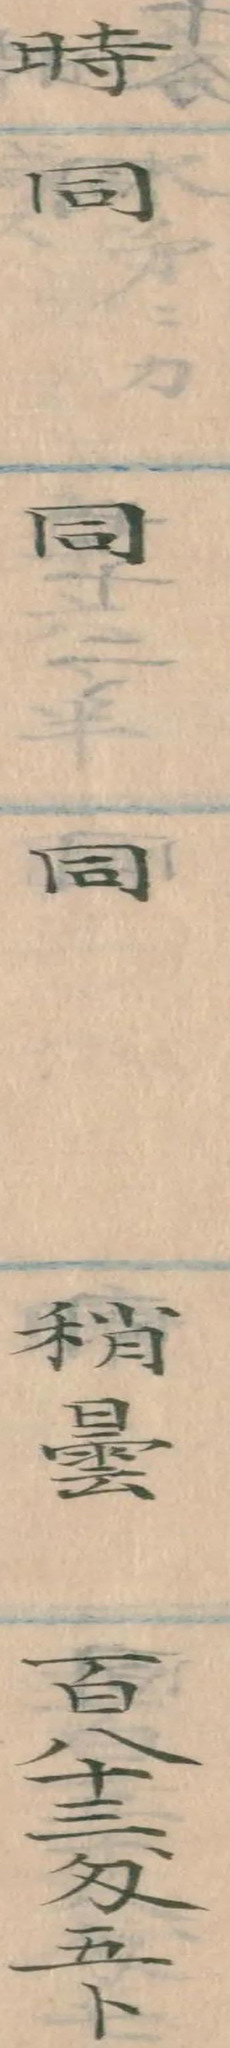三時同同同稍曇百八十三匁五分
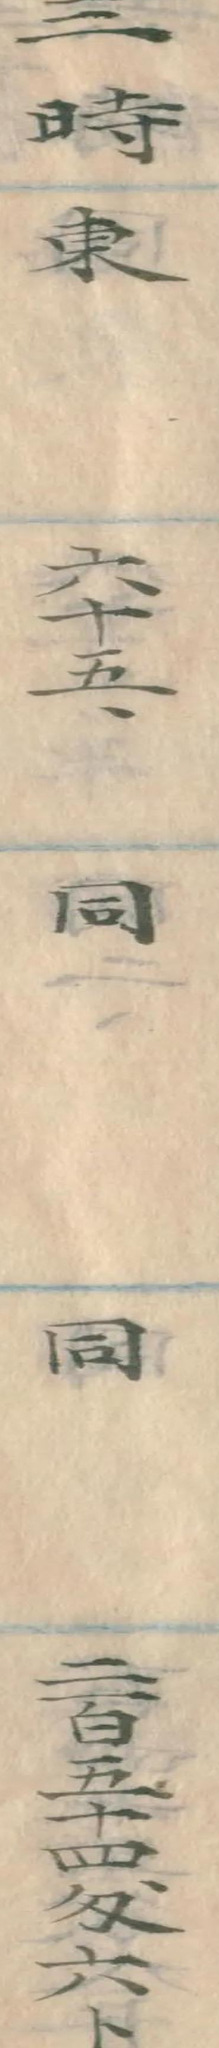三時東六十五ヽ同同二百五十四匁六分

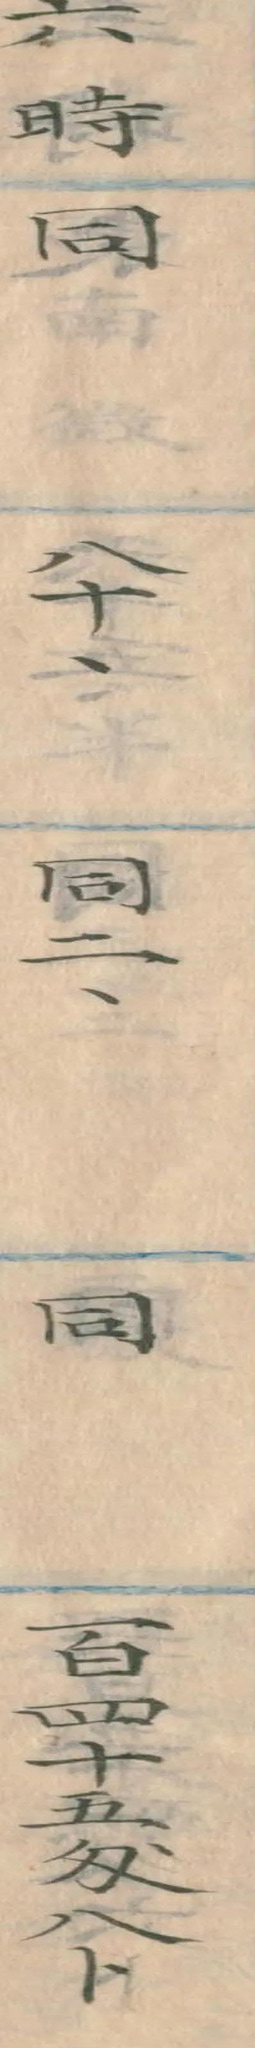六時同八十ヽ同二ヽ同百四十五匁八分
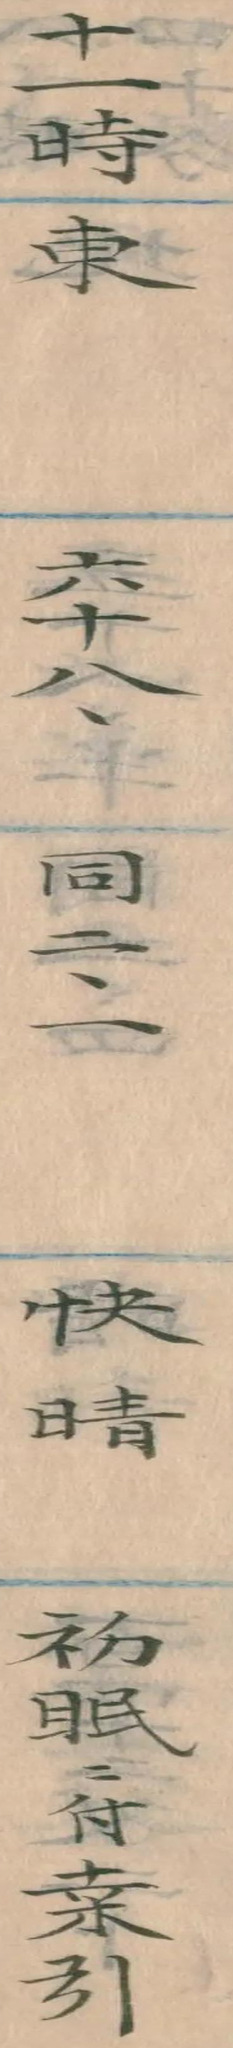十一時東六十八ヽ同二ヽ一快晴初眠ニ付桑引

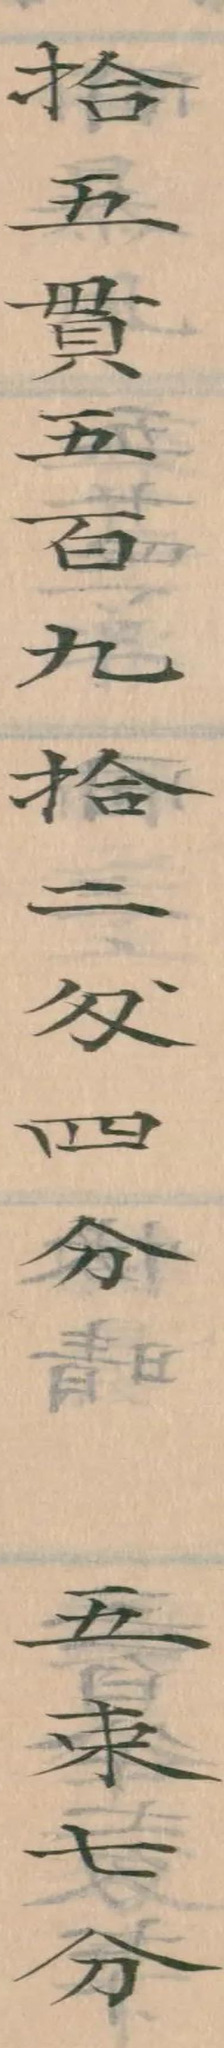拾五貫五百九拾二匁四分五束七分

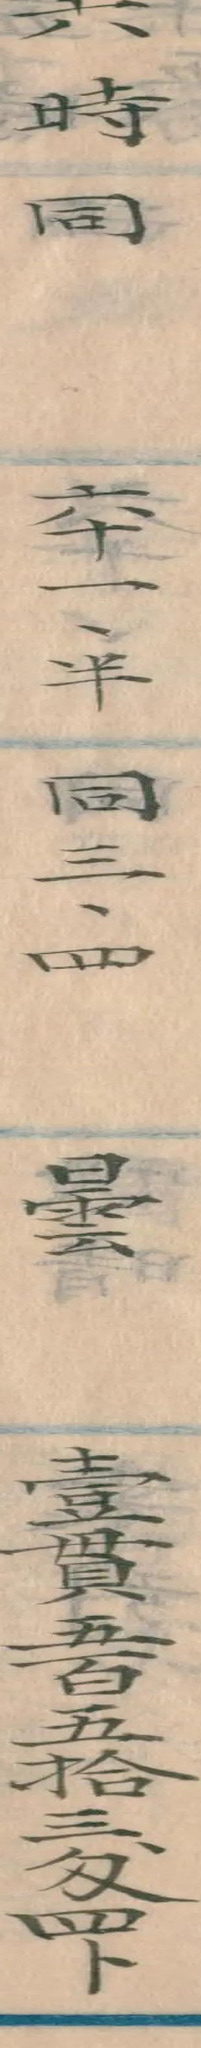六時同六十一ヽ半同三ヽ四曇壱貫五百五拾三匁四分
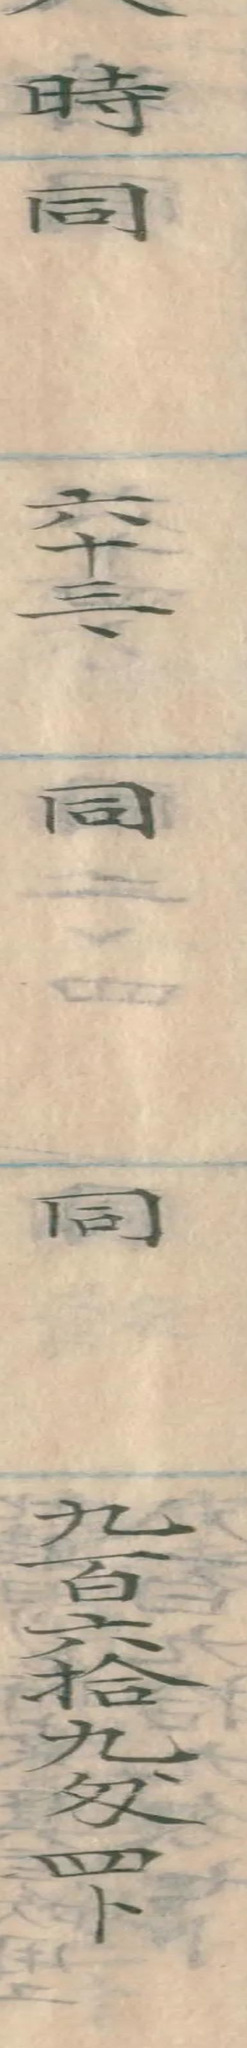八時同六十三ヽ同同九百六拾九匁四分
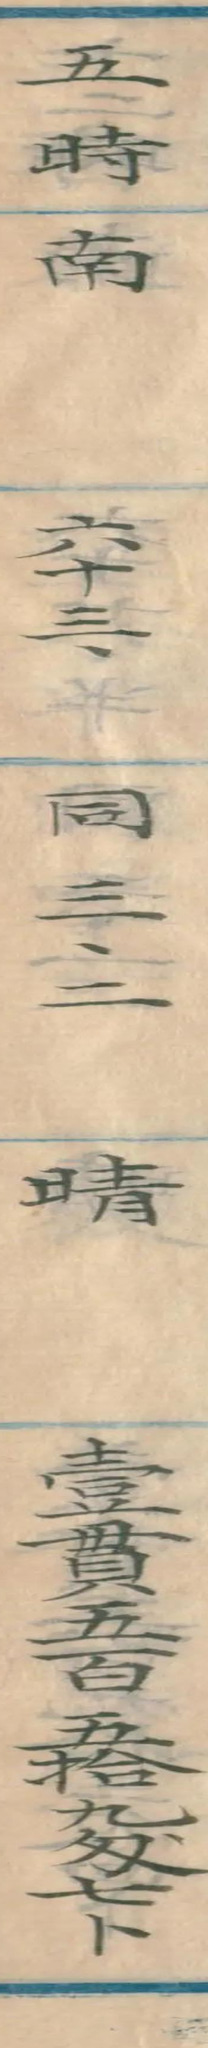十九日五時南六十三ヽ同三ヽ二晴壱貫五百五拾九匁七分
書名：蚕桑集成
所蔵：国立国会図書館 National Diet Library, JAPAN
